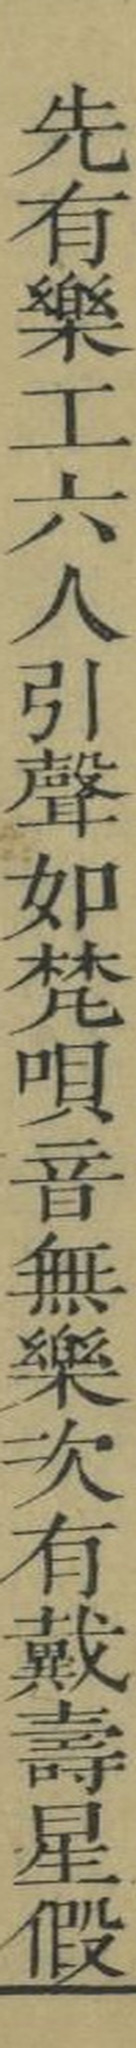先有樂工六人引聲如梵唄音無樂次有戴壽星假
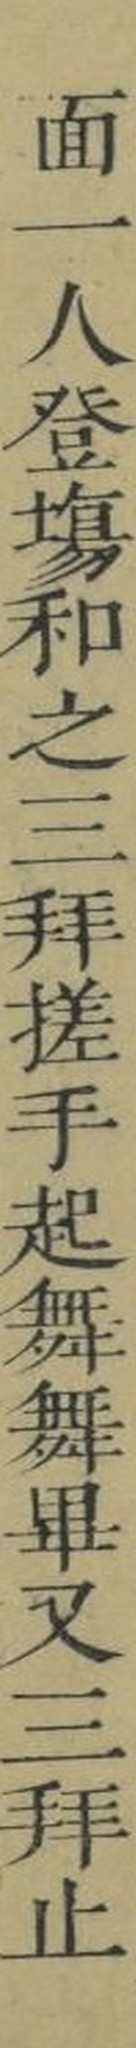面一人登塲和之三拜搓手起舞舞畢又三拜止
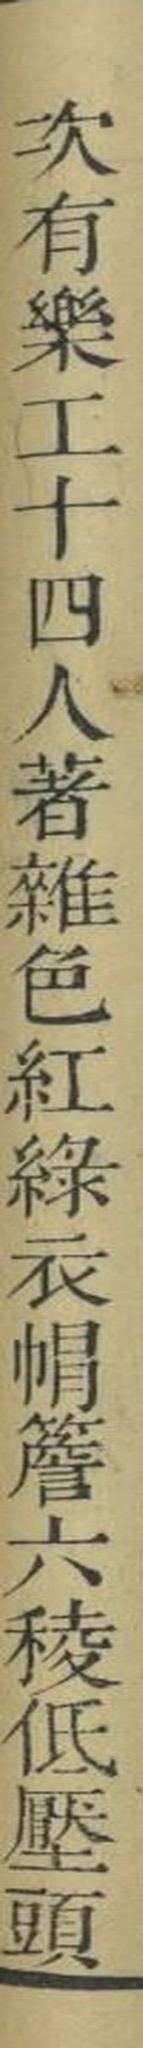次有樂工十四人著雜色紅綠衣帽簷六稜低壓頭
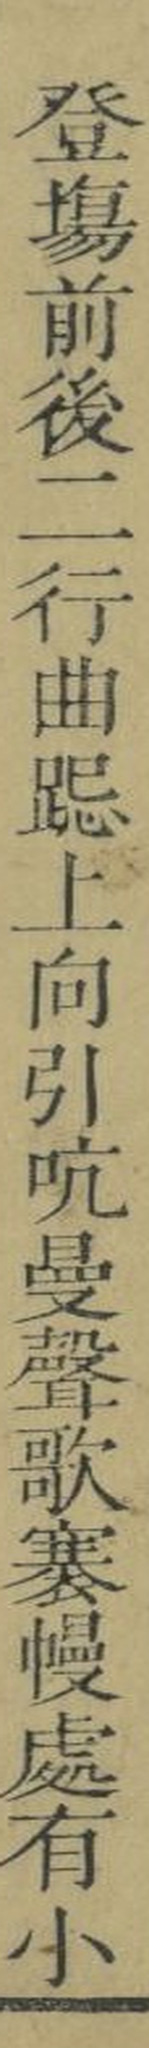登塲前後二行曲跽上向引吭曼聲歌褰幔處有小
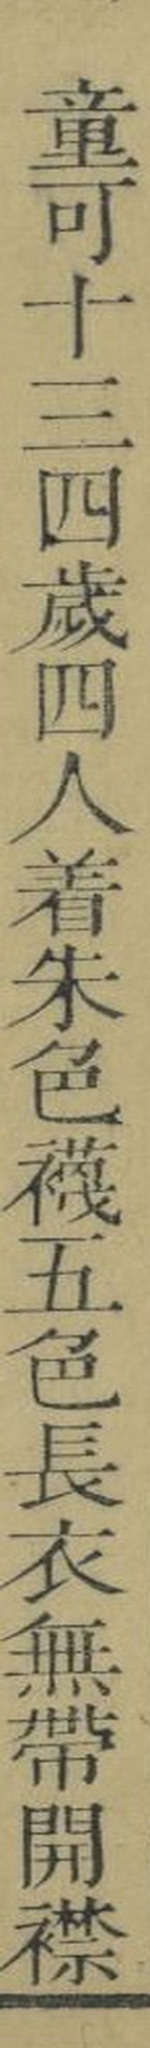童可十三四歲四人着朱色襪五色長衣無帶開襟
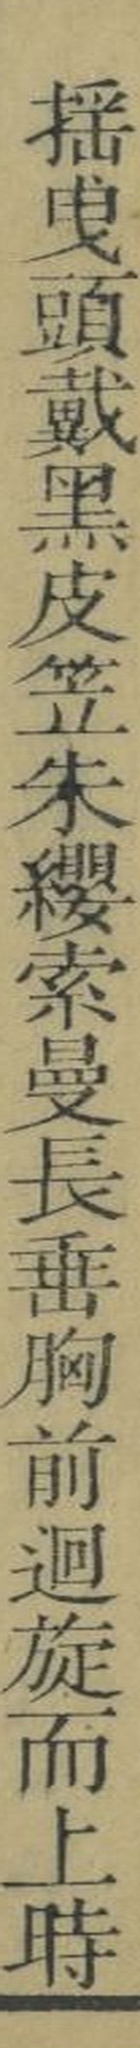揺拽頭戴黑皮笠朱纓索曼長垂胸前廻旋而上時
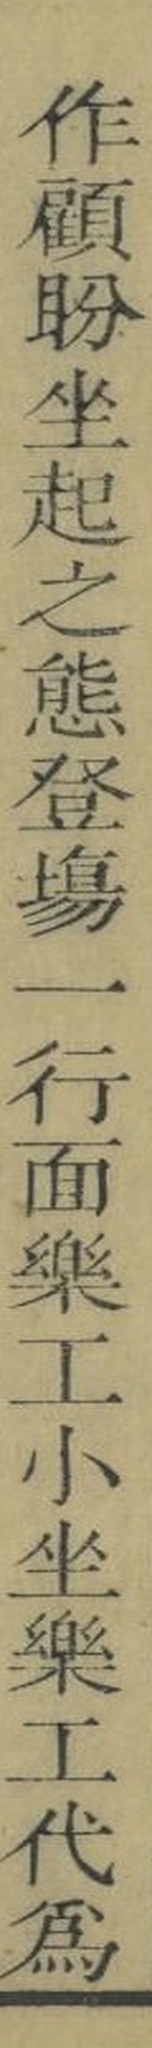作顧盼坐起之態登塲一行面樂工小坐樂工代爲
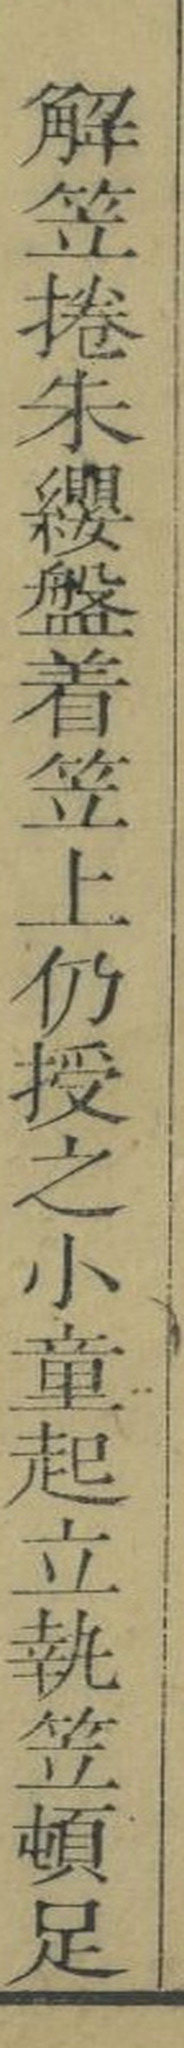解笠捲朱纓盤着笠上仍授之小童起立執笠頓足
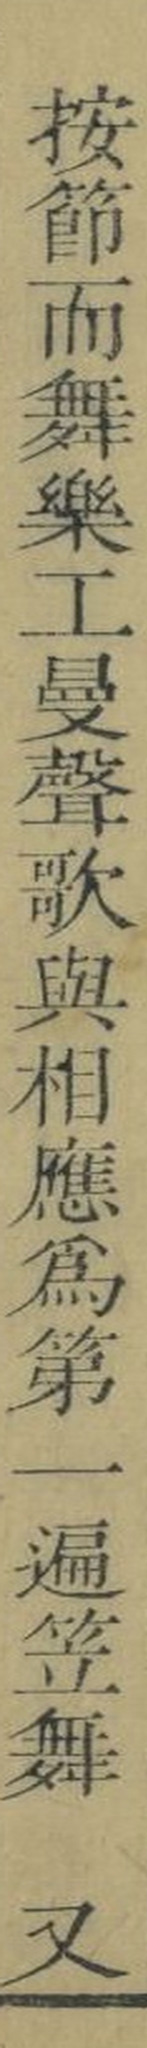按節而舞樂工曼聲歌與相應爲第一遍笠舞又
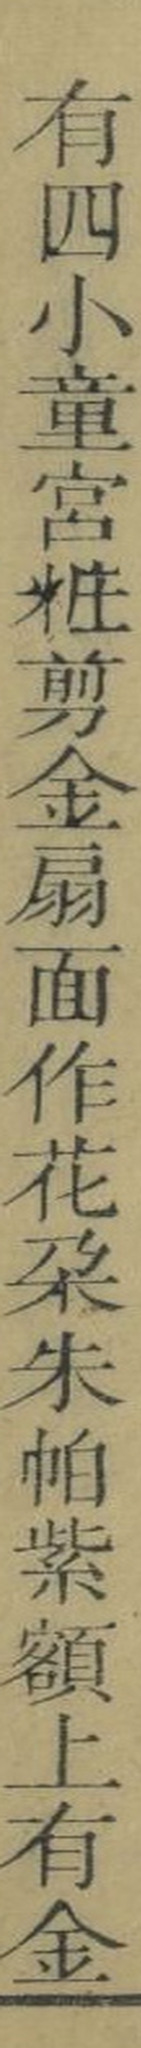有四小童宮粧剪金扇面作花朶朱帕紫額上有金

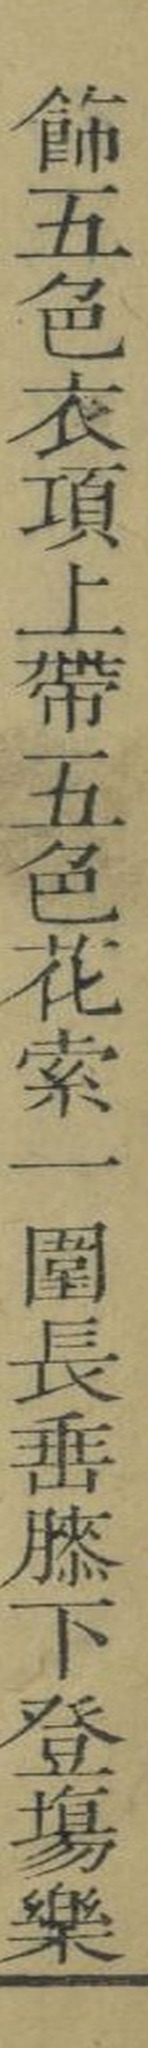飾五色衣項上帶五色花索一圍長垂膝下登塲樂
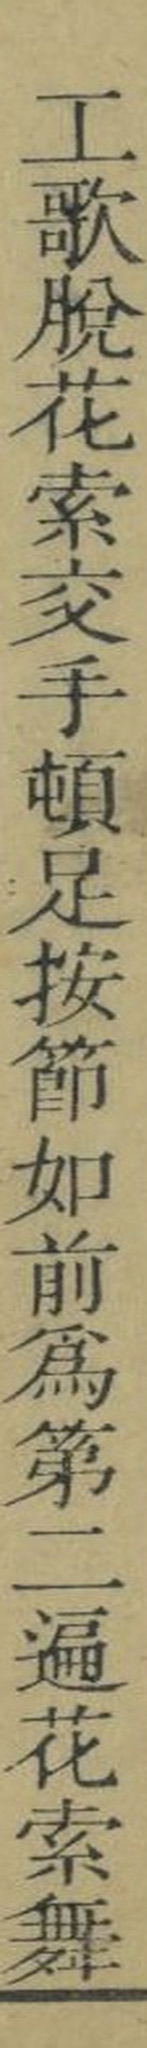工歌脱花索交手頓足按節如前爲第二遍花索舞
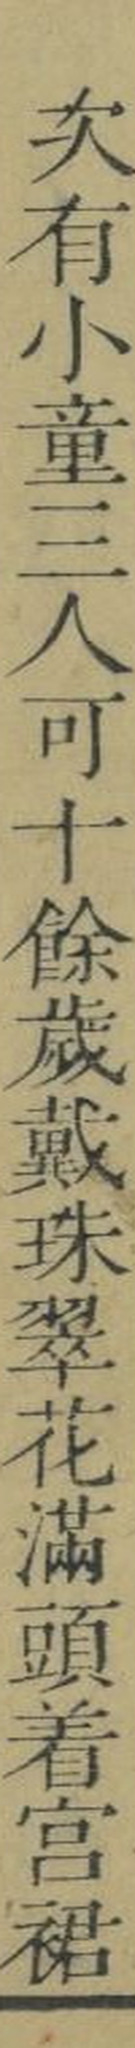次有小童三人可十餘歲戴珠翠花滿頭着宫裙
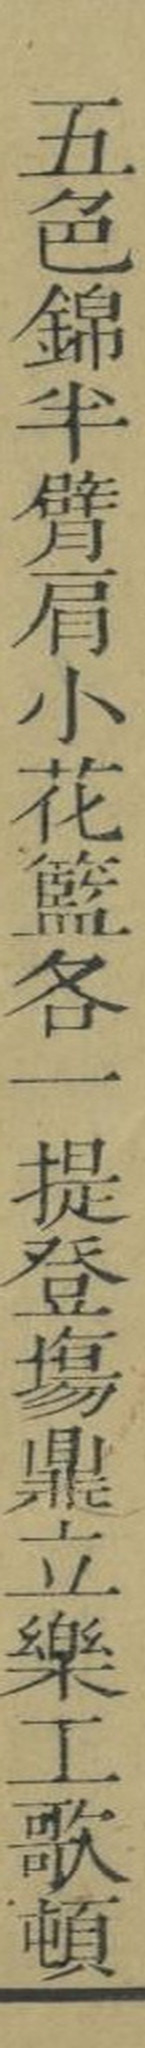五色錦半臂肩小花籃各一提登塲鼎立樂工歌頓
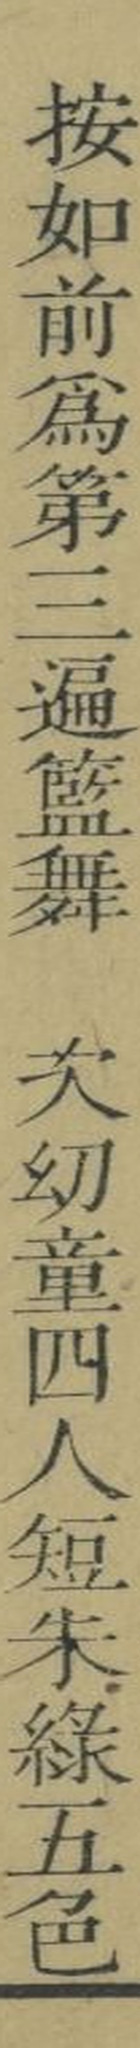按如前爲第三遍籃舞次幼童四人短朱綠五色
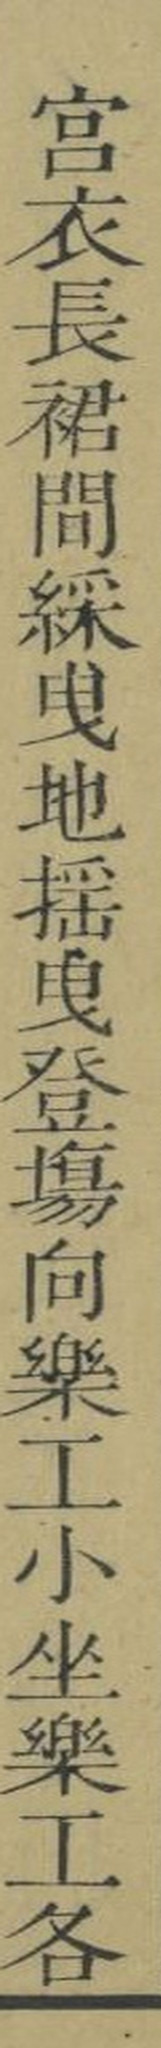宫衣長裙間綵拽地揺拽登塲向樂工小坐樂工各
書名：中山伝信録 巻二
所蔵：University of the Ryukyus Library
